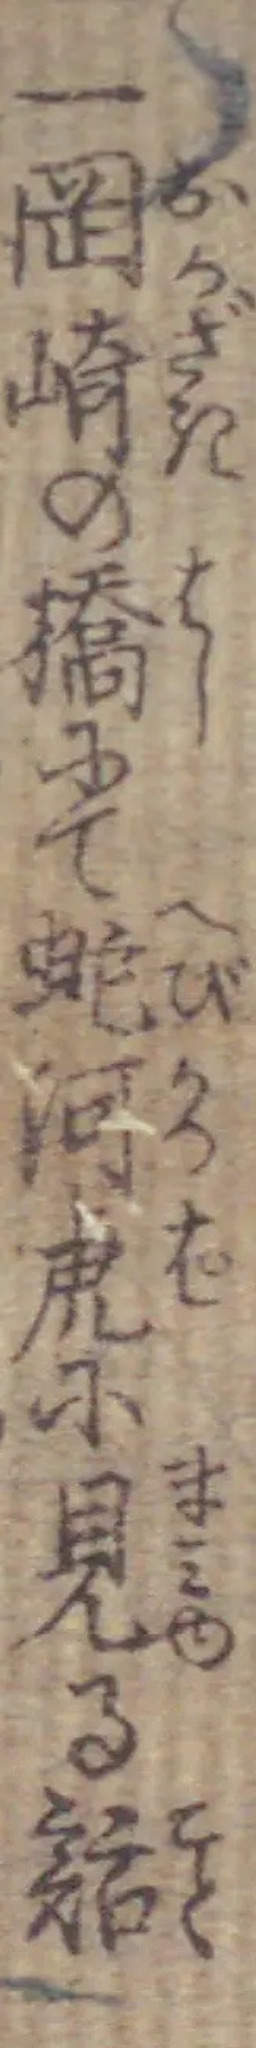一岡崎の橋にて蛇河虎に見る話
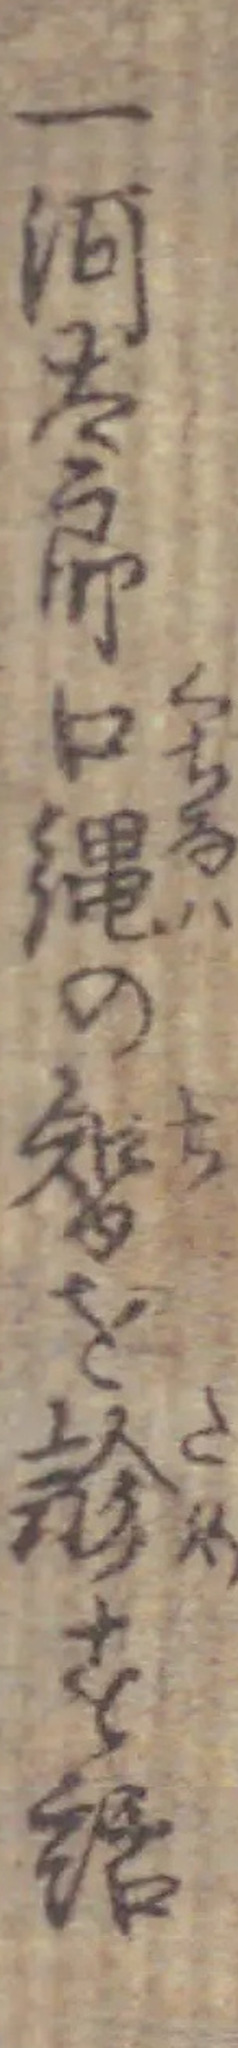一河太郎口縄の智を診す話
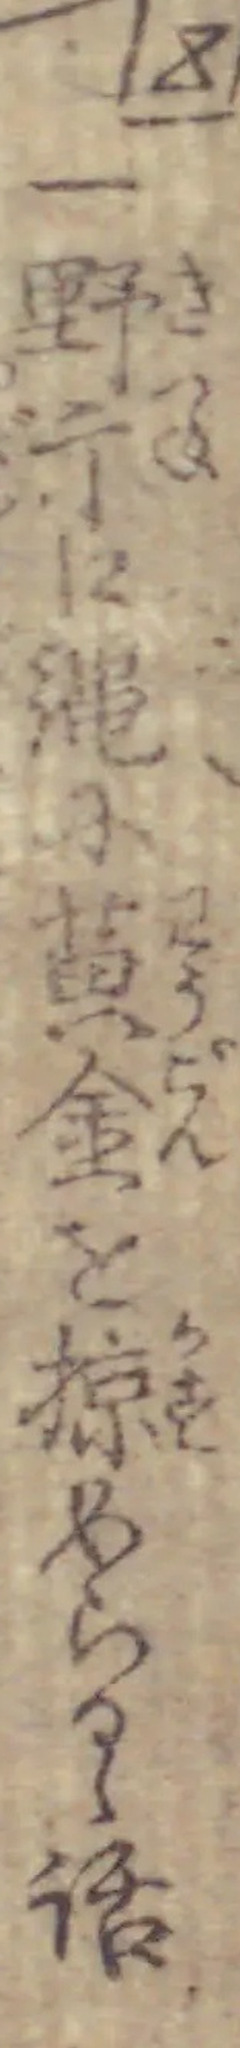一野干口縄に黄金を掠めらるゝ話
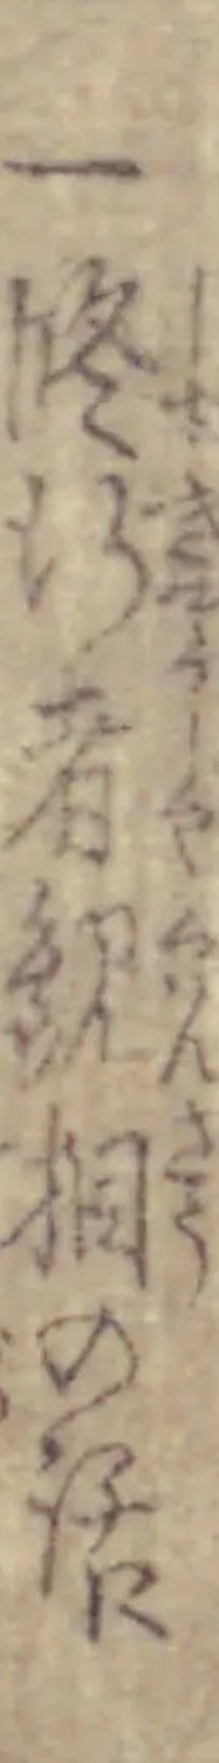一修行者観相の話
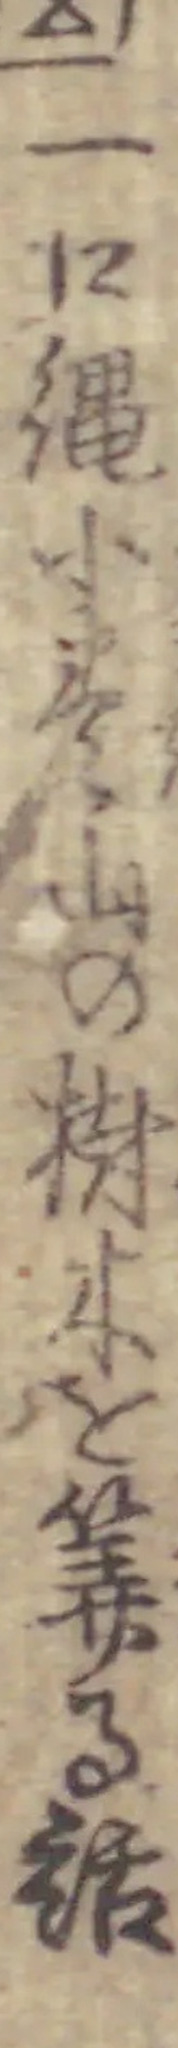一口縄小巻山の樹木を算る話
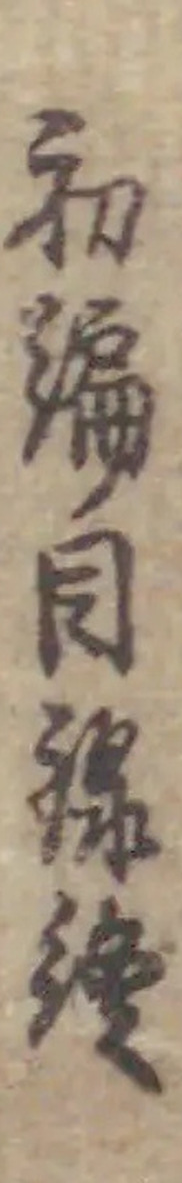初編目録終

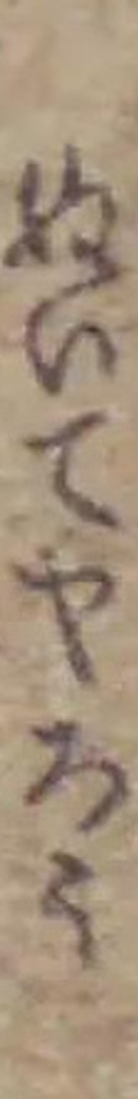ぬいてやろう
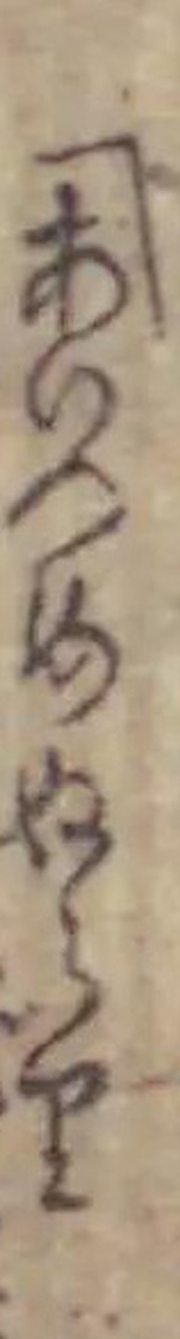〽あいつめぬらり
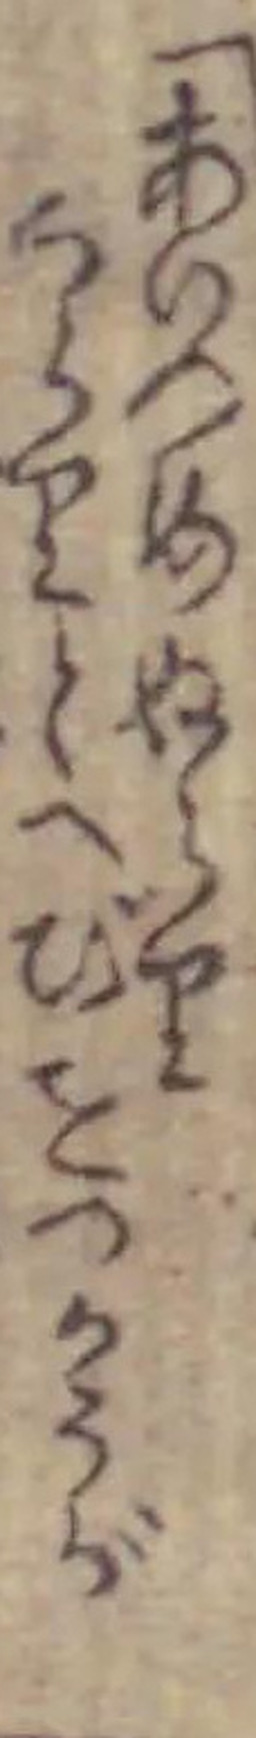くらりとへびをつかうが
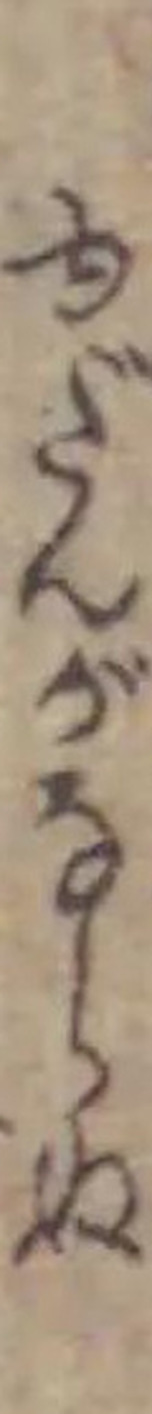ゆだんがならぬ
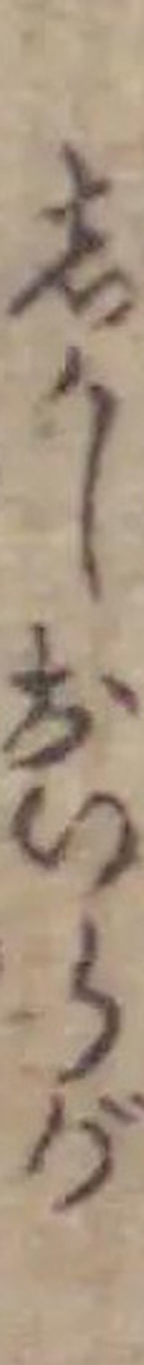しかしおいらが
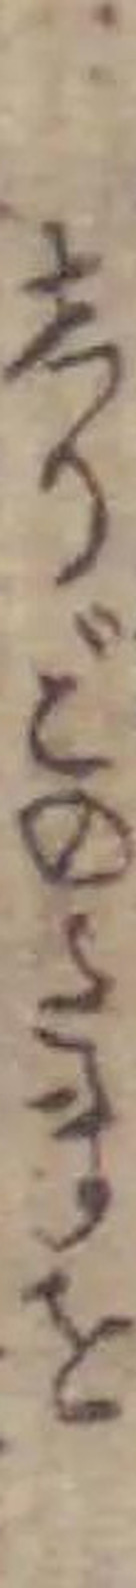しりごのたまを
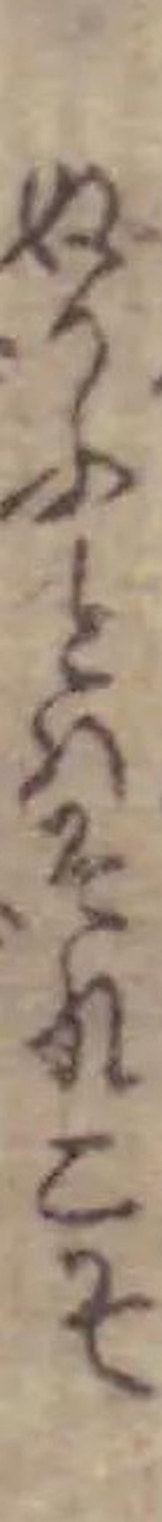ぬかふとはそれこそ
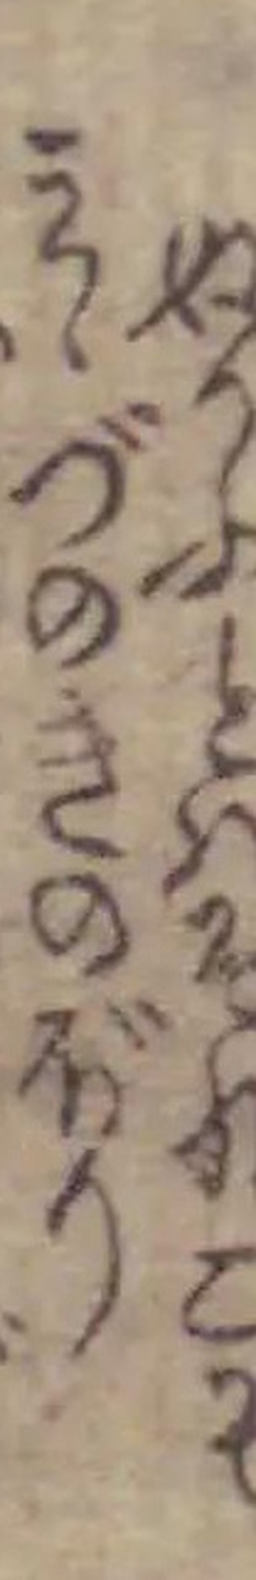みゝづのきのぼり
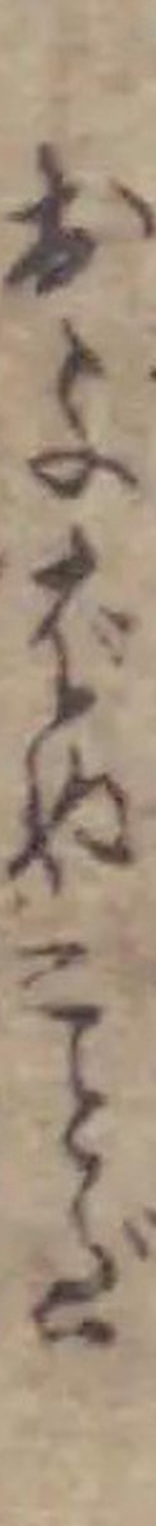およばぬことだ
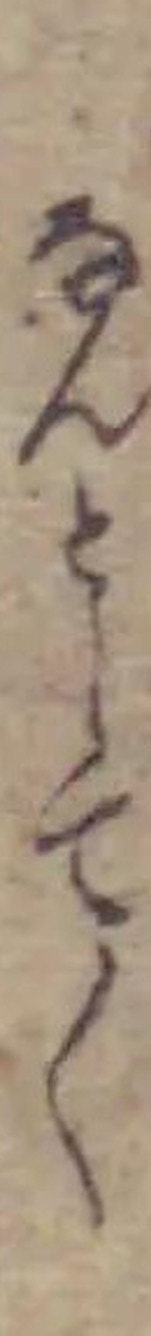なんとして〳〵
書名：化物太平記 3巻
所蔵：国立国会図書館 National Diet Library, JAPAN
